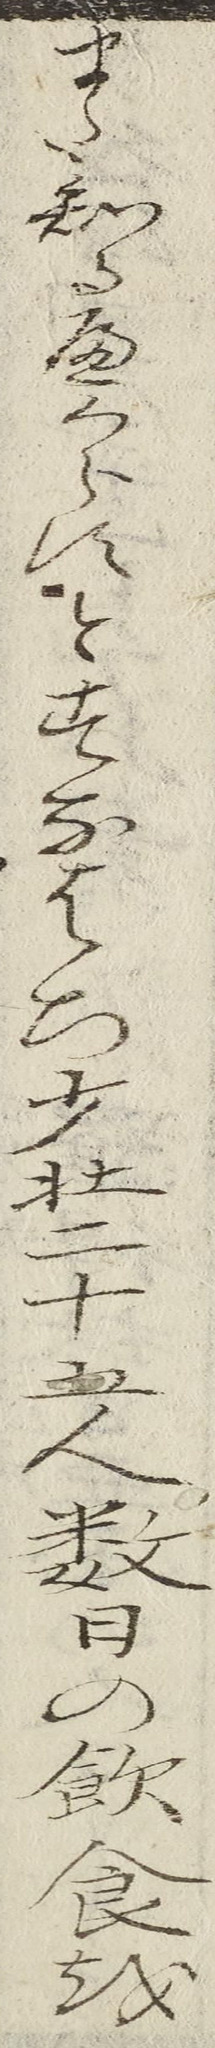また知るへからすとすなはち少壮二十五人数日の飲食を
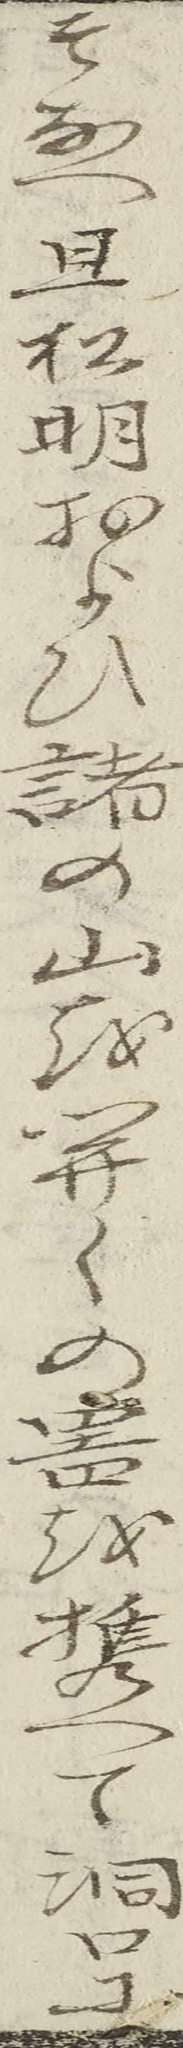そなへ且松明およひ諸の山を開くの器を携へて洞口に
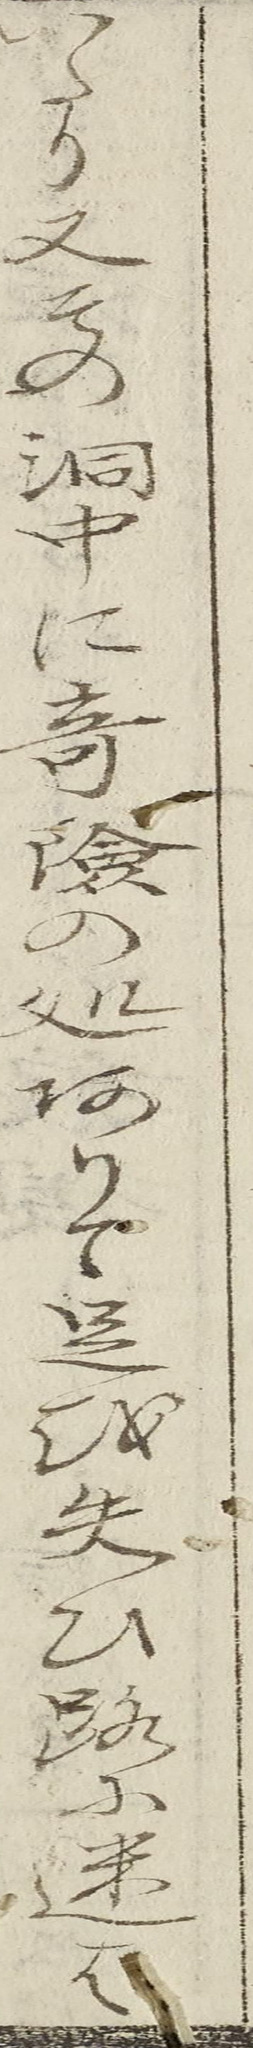いたり又その洞中に奇険の処ありて足を失ひ路に迷は
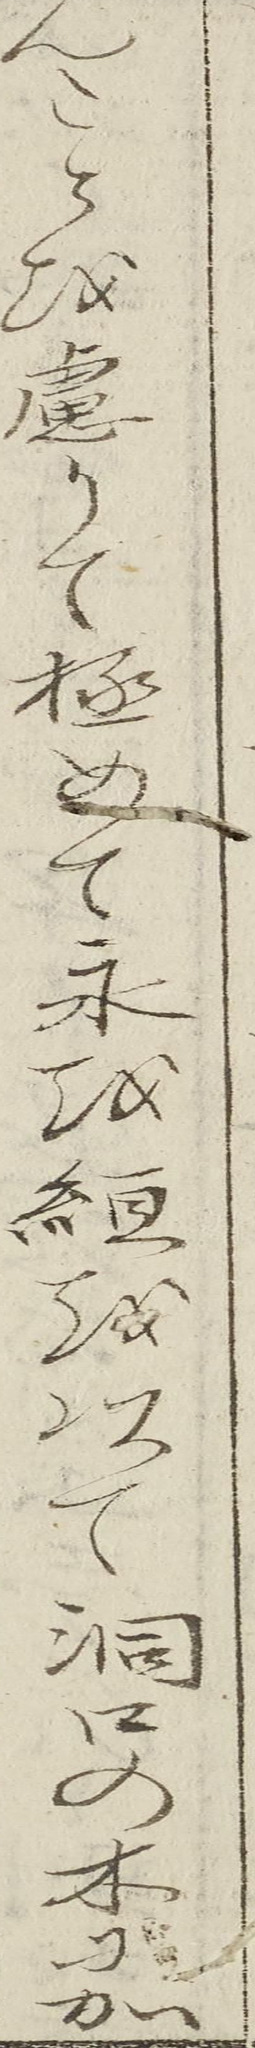んことを慮りて極めて永を絙を以て洞口の木にか
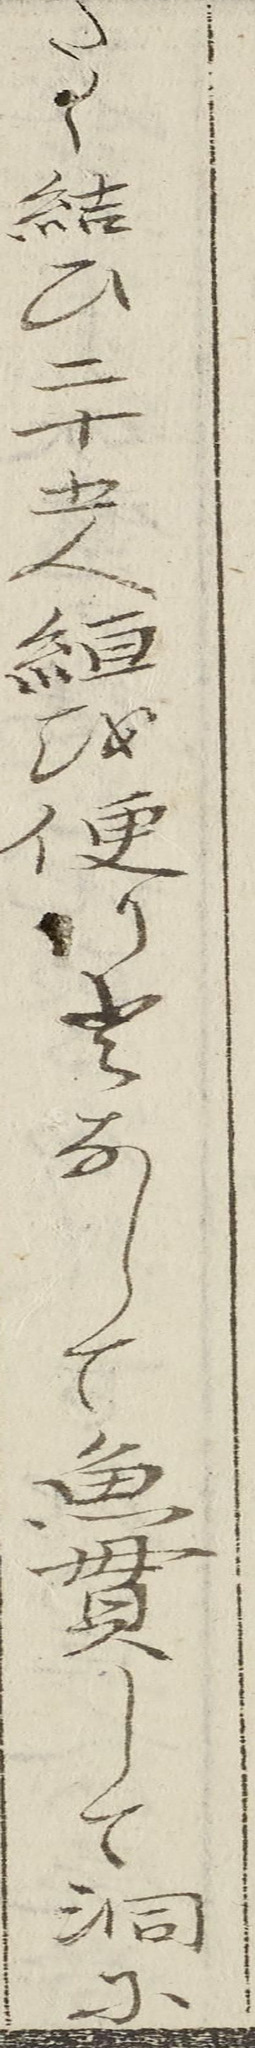たく結ひ二十五人絙を便りとなして魚貫して洞に
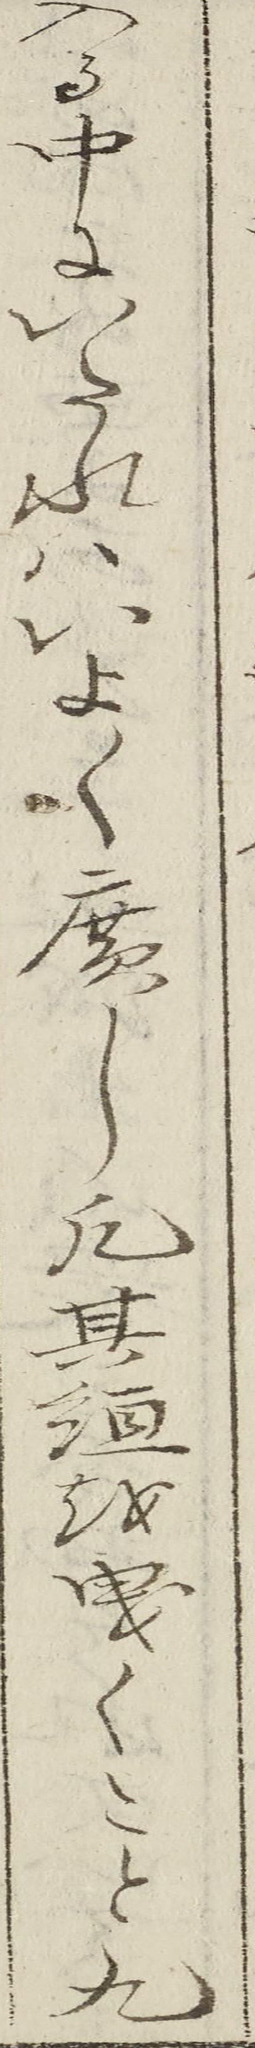入る中にいたれハいよ〳〵廣し凡其絙を曳くこと九
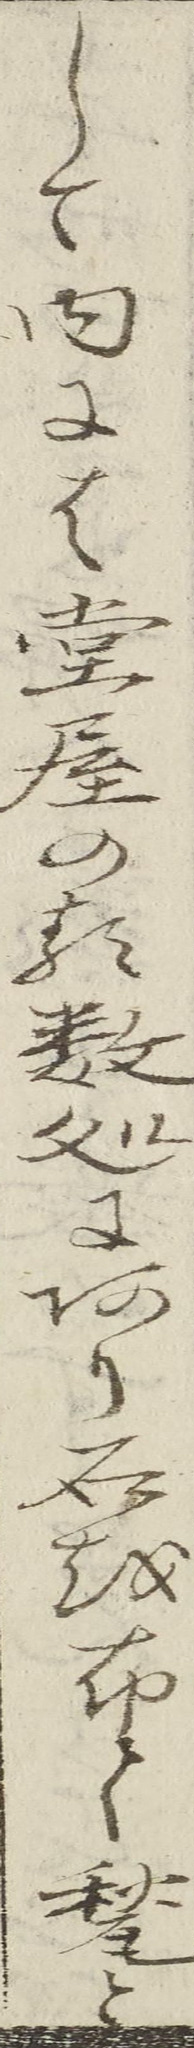して内には堂屋の類数処にあり石を布て甃と
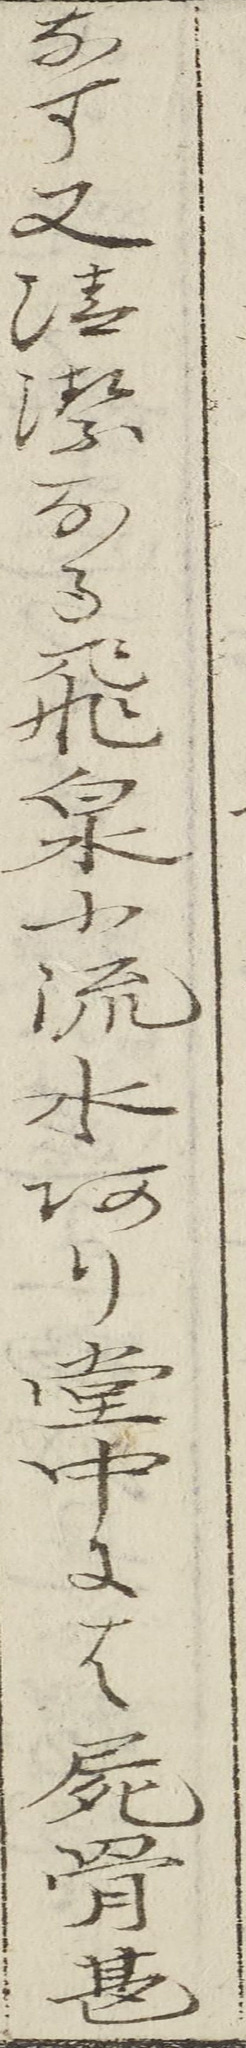なす方清潔なる飛泉に流水あり堂中には屍骨甚
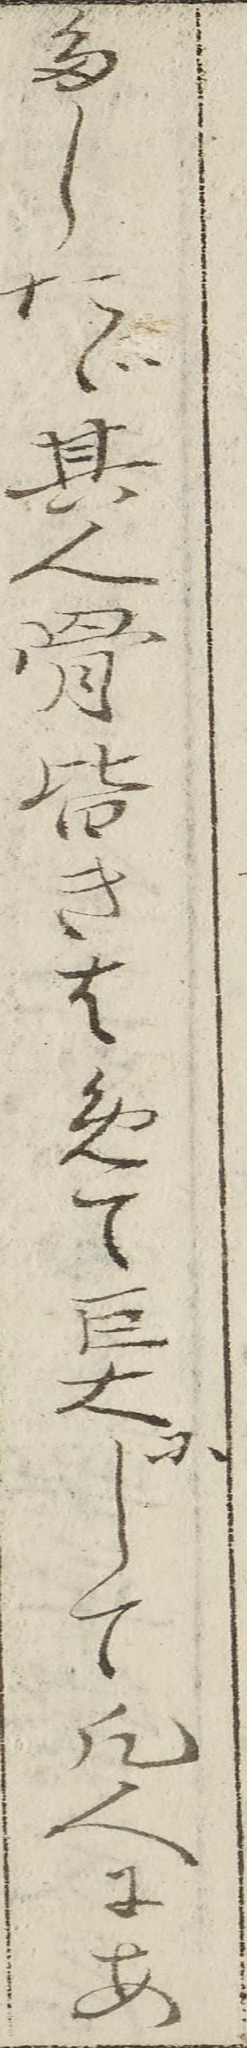たしたたゞ其人骨皆きはめて巨大にして凡人にあ
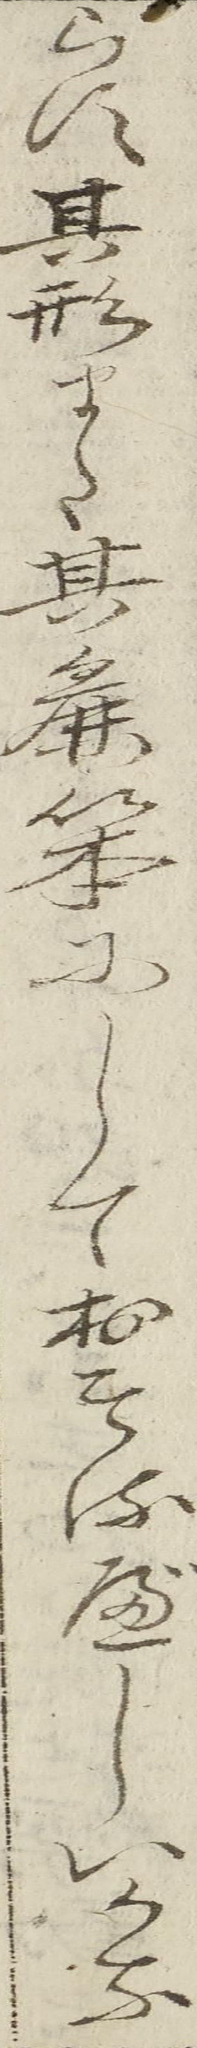らすその形また其廉笨にしておそるべしいかな
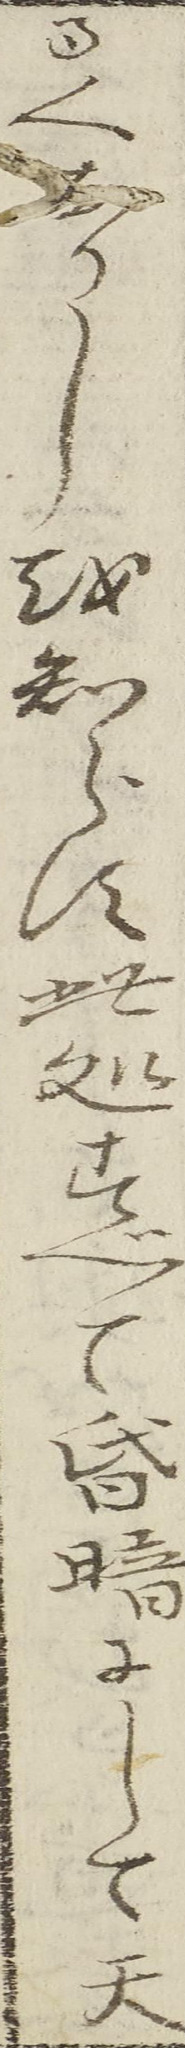る人なりしを知らす此処すべて昏暗にして天

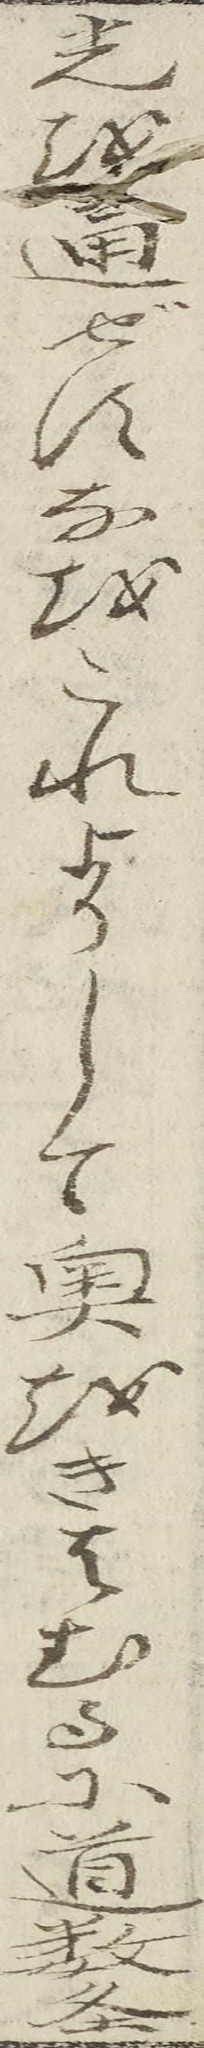光を通ぜすなをこれよりして奥をきはむるに道数条
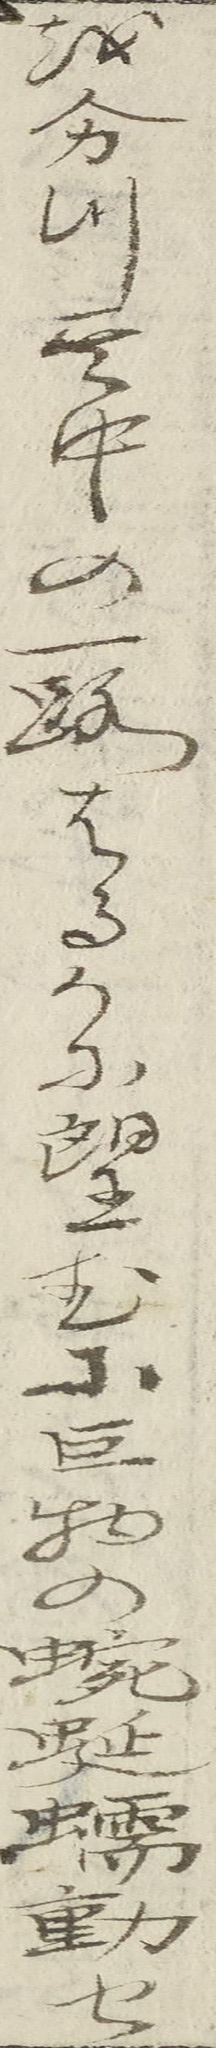を分つ其中の一路はるかに望むに巨物の蛇蜒蠕動せ
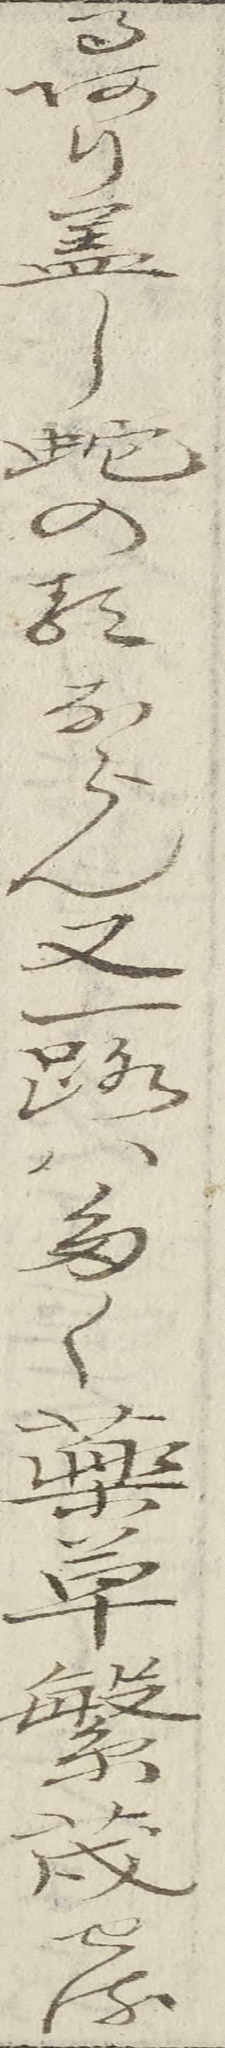るあり蓋し蛇の類ならん又一路ハ多く薬草繁茂せる
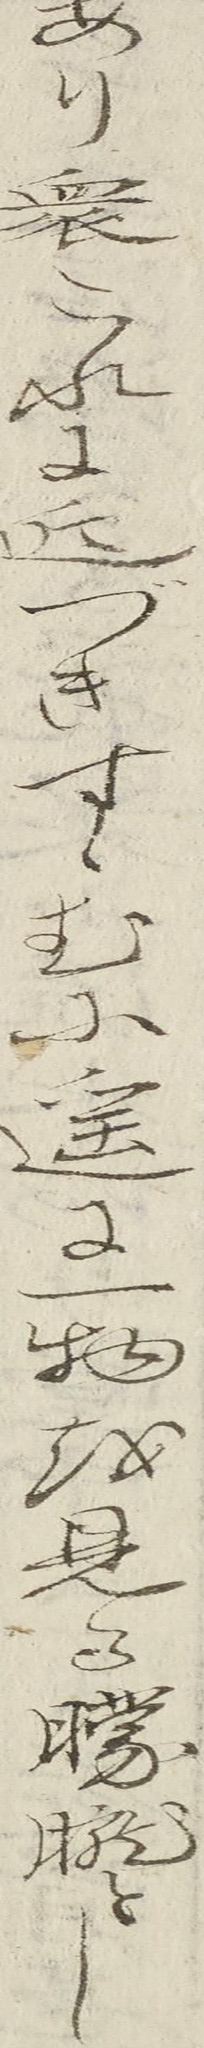あり衆これに近づきすゝむに遥に一物を見る朦朧とし
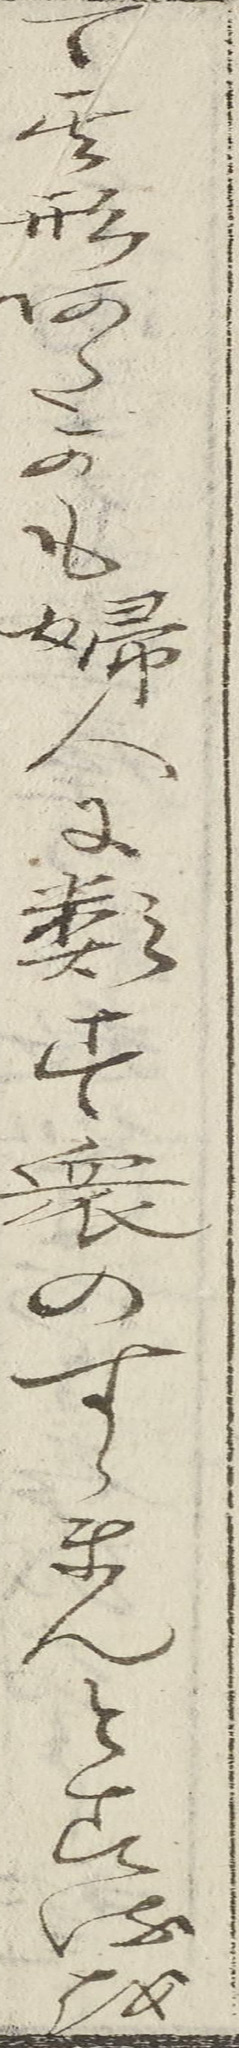て其形あたかも婦人に類す衆のすゝまんとするを
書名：西洋雜記　乾
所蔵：東京大学地震研究所図書室 Earthquake Research Institute Library, The University of Tokyo, JAPAN
